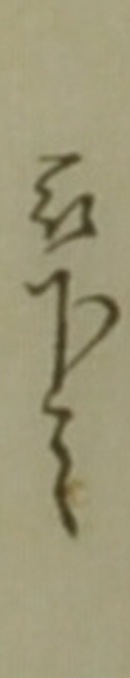被下之

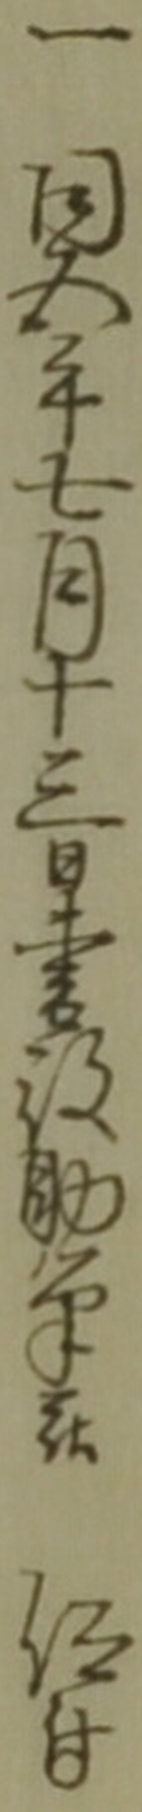一同五午七月十三日書役助筆被仰付
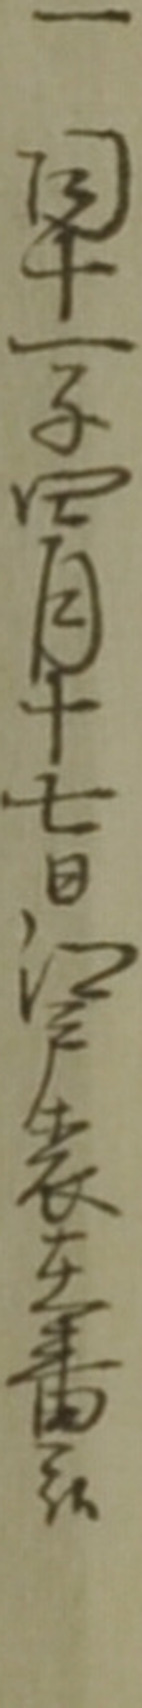一同十一子四月十七日江戸表在番被
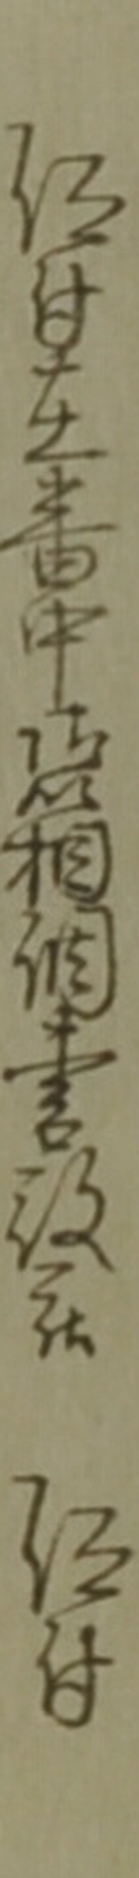仰付在番中御箱調書役被仰付
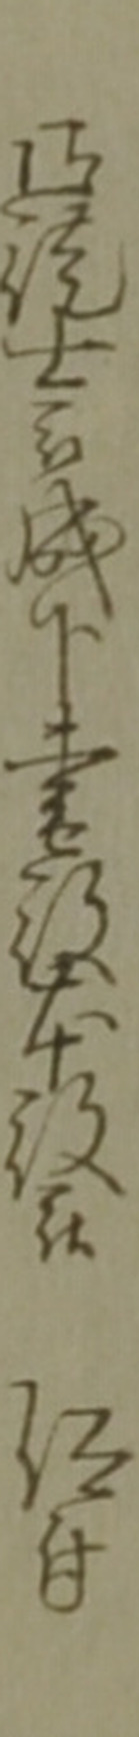御徒士被成下書役本役被仰付
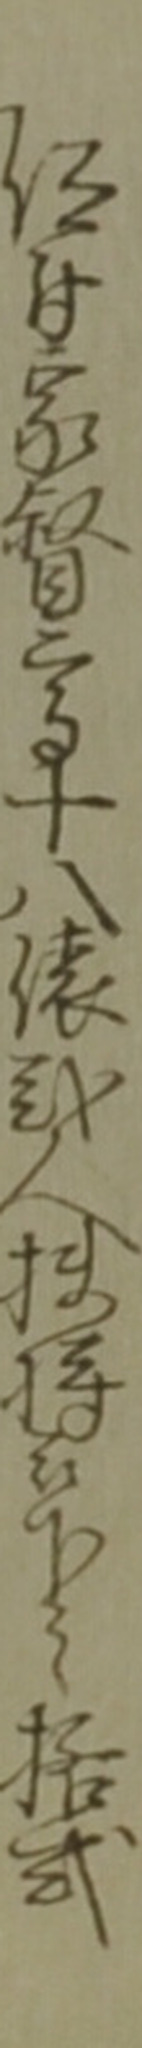仰付家督高十八俵弐人扶持被下之格式
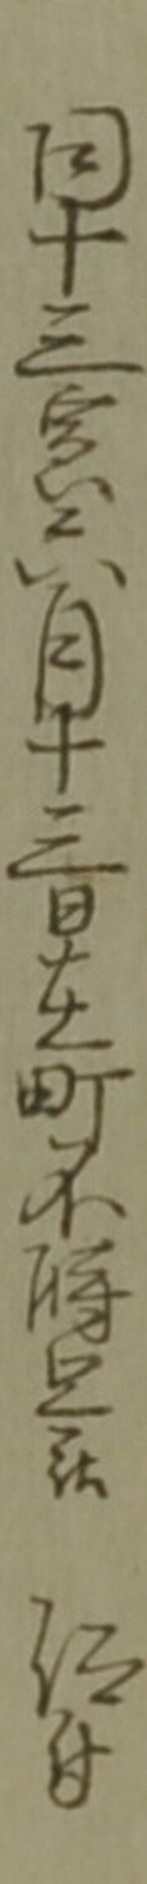一同十三寅六月十三日在町不時廻被仰付
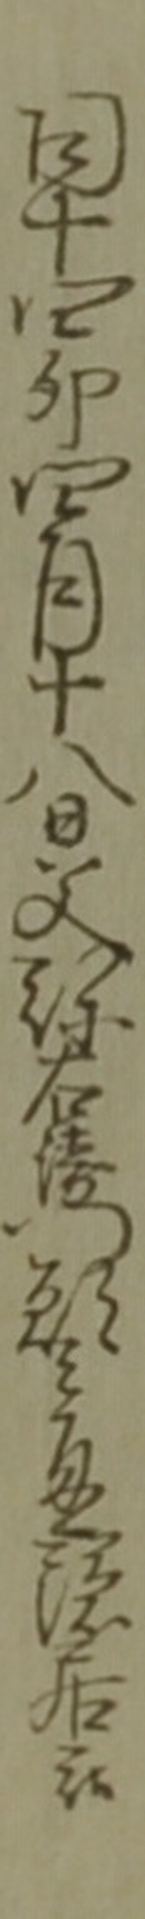一同十四卯四月十八日父弥右衛門願之通隠居被
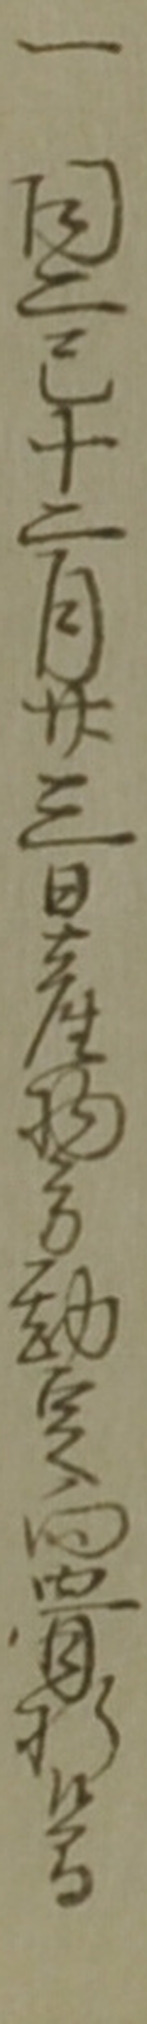一同二巳十二廿三日産物方勘定向骨折候間
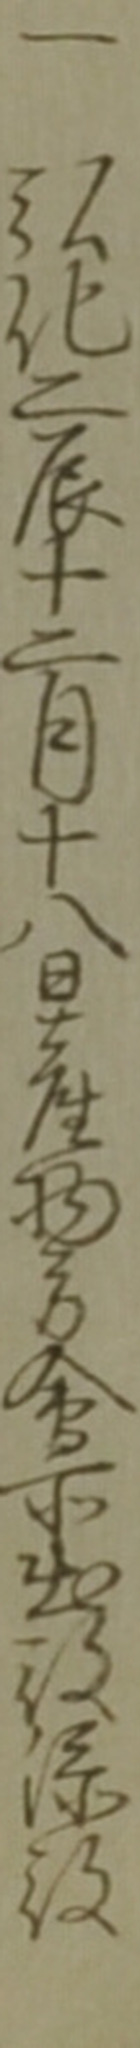一弘化二辰十二月十八日産物方会所出役添役
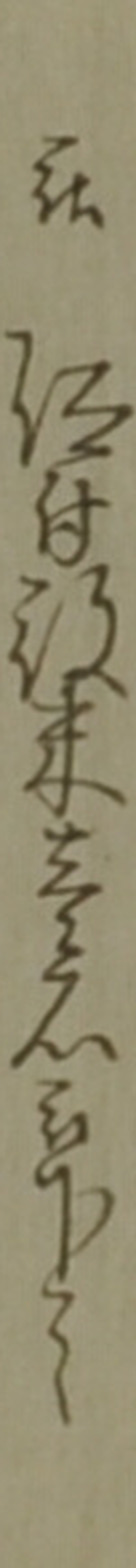被仰付役米壱石被下之

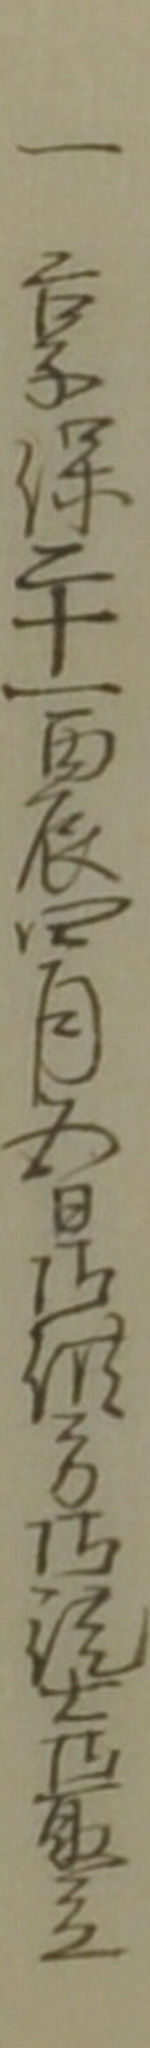一享保二十一丙辰四月五日御供方御徒士御取立
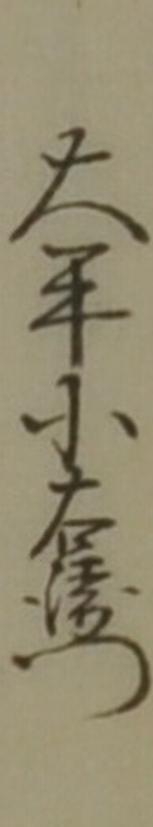大平小右衛門
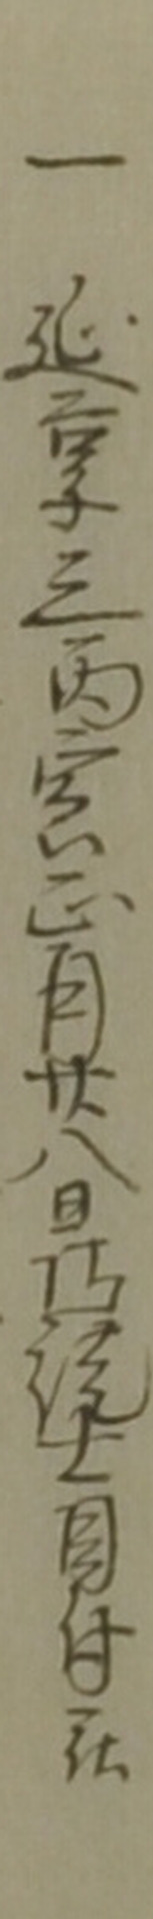一延享三丙寅正月廿八日御徒士目付被
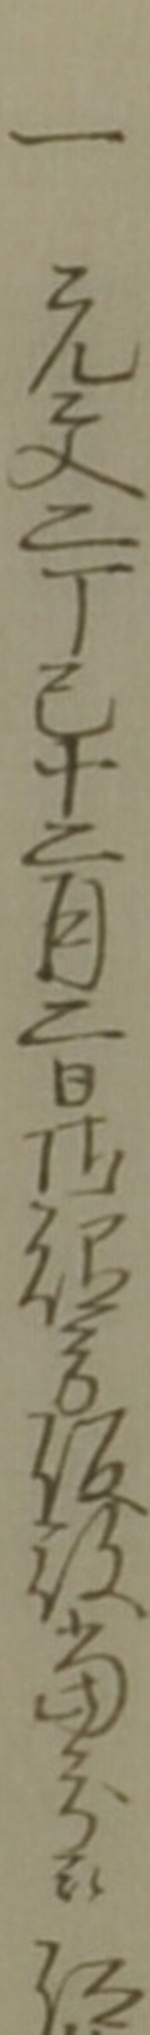一元文二丁巳十二月二日御賄方仮役当分被仰付
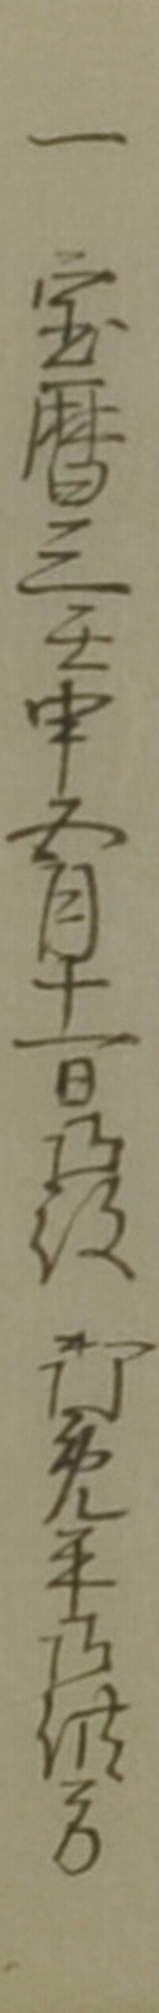一宝暦三壬申五月十一日御役御免平御供方
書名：無足諸士勤仕録（六）
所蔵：伊那市立高遠町図書館・合同会社AMANE
